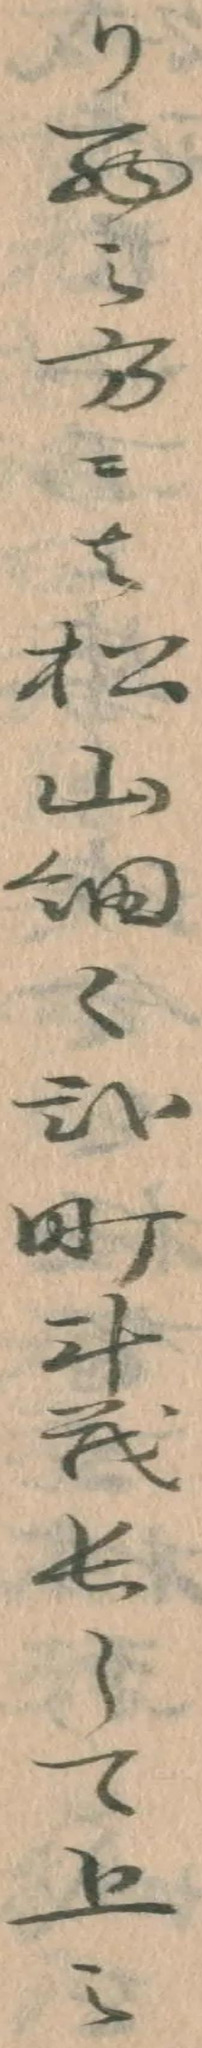り西之方には松山細く弐町計も長して上之
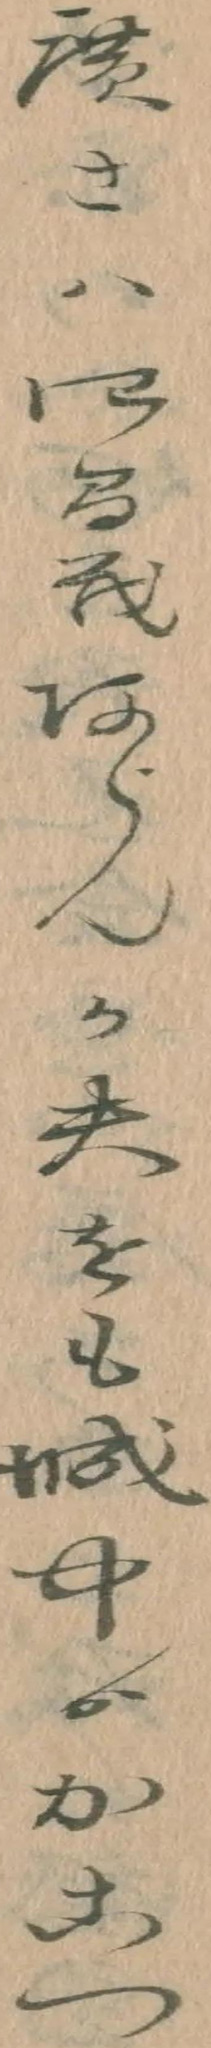広さは四間もあらんか夫をも城中ゟかこつ
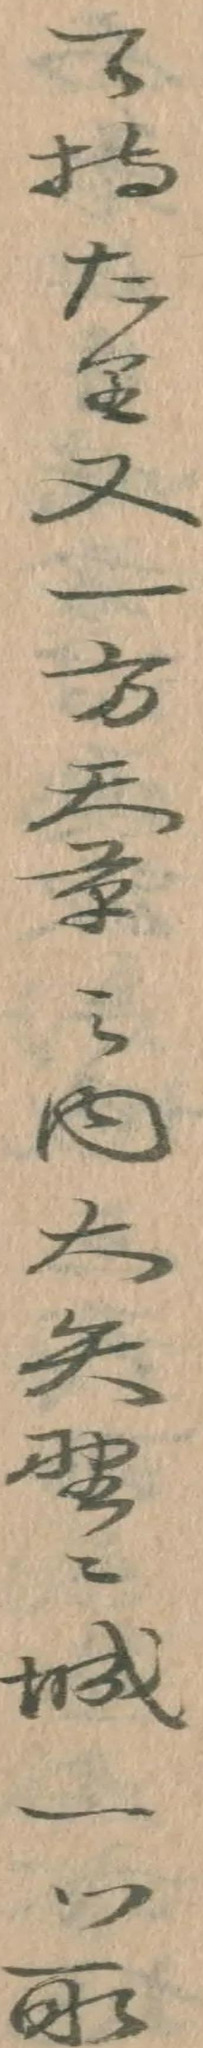て持たり又一方天草之内大矢野に城一ツ取
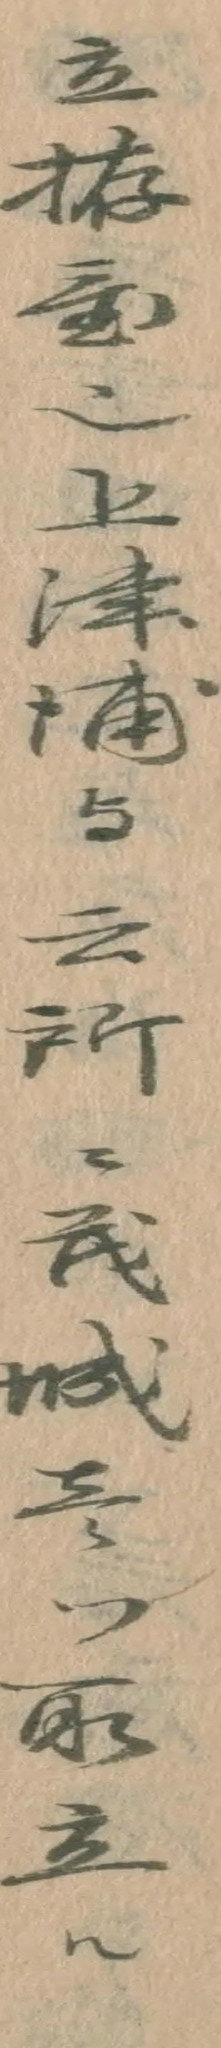立拵置也上津浦と云所にも城壱ツ取立る
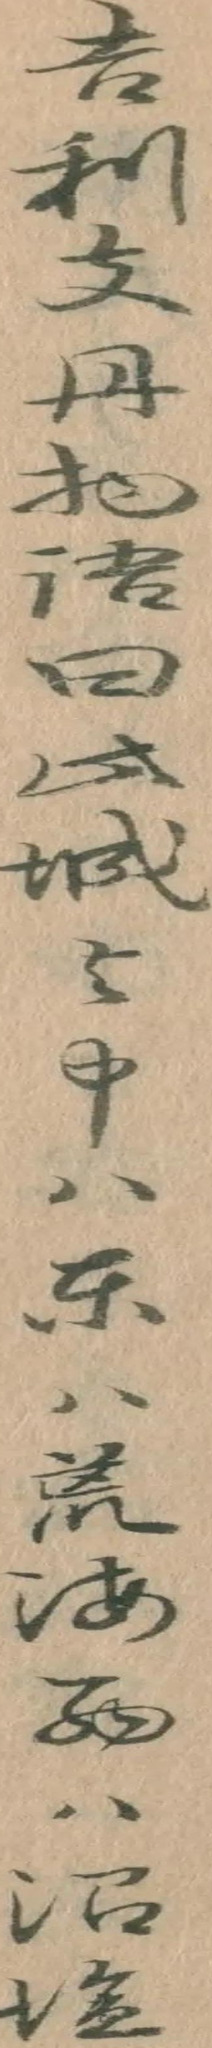吉利支丹物語曰此城と申は東は荒海西は沼塩
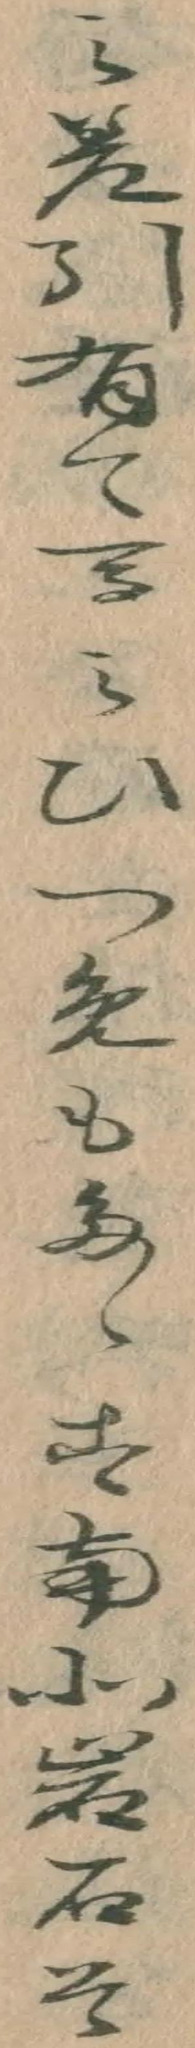之差引有て馬之ひつめもたゝす南北岩石そ
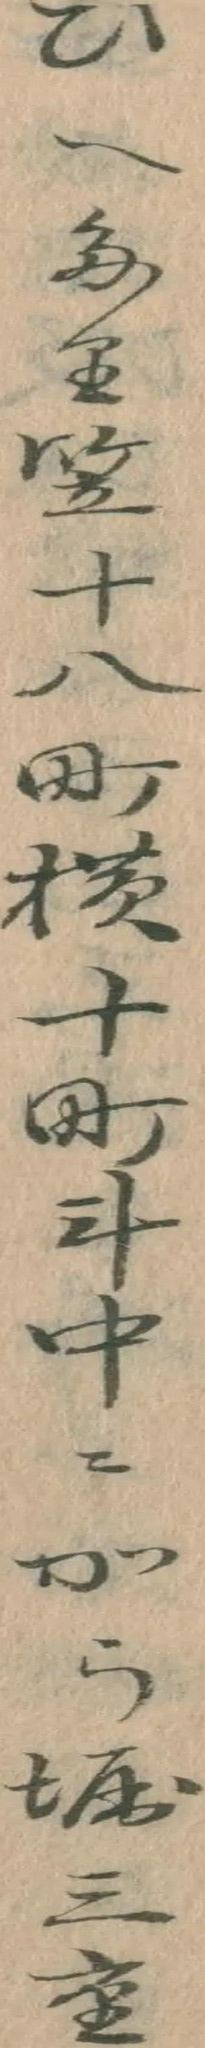ひへたり竪十八町横十町計中にから掘三重
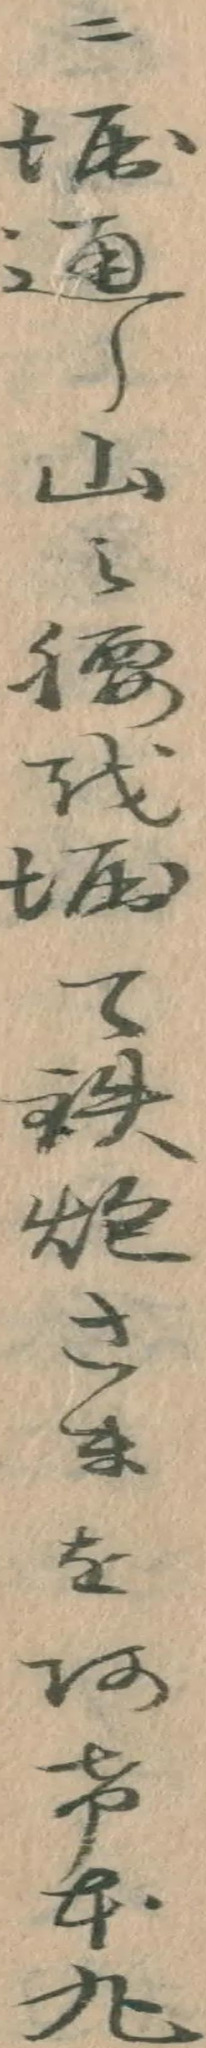に掘通し山之腰を掘て鉄炮さまをあけ本丸
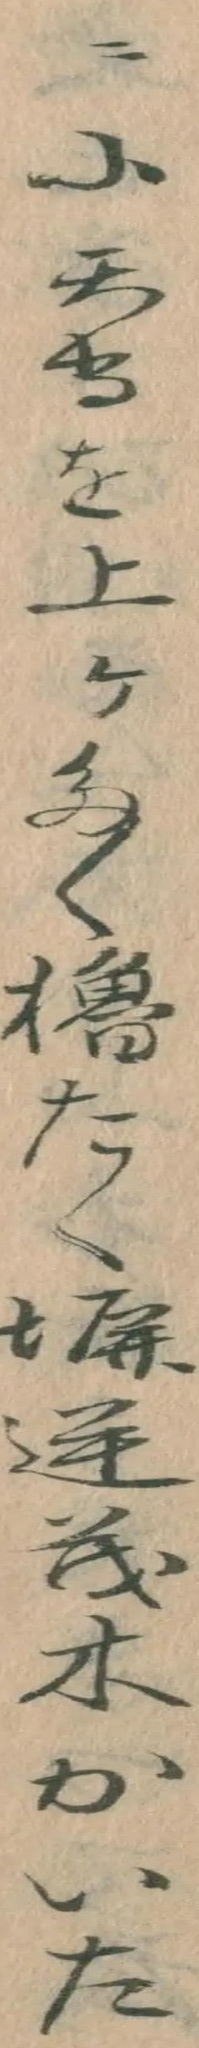に小天守を上ヶたく櫓たく塀逆茂木かいた
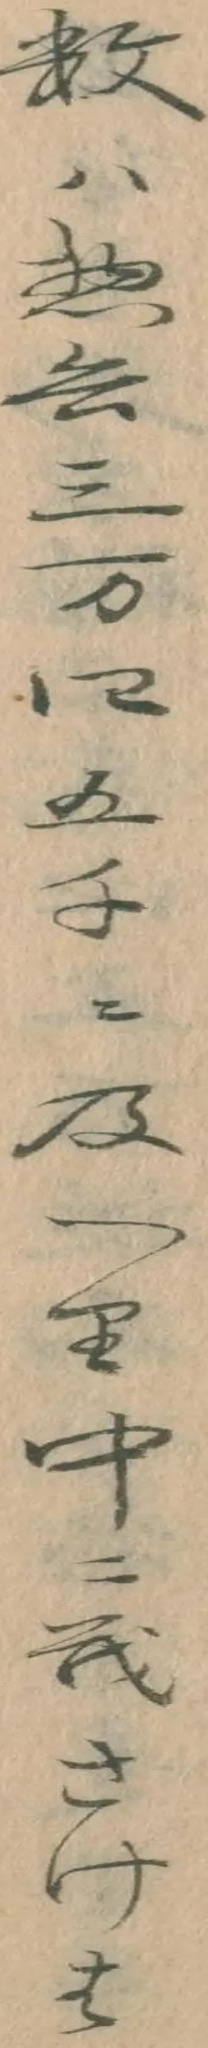数は惣兵三万四五千に及へり中にもさけは

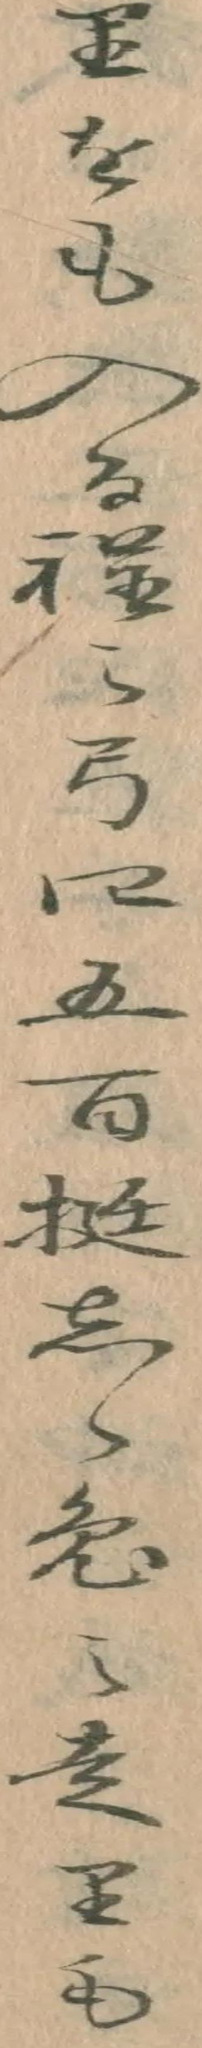りをも入る程之弓四五百挺しゝ兎之走りも
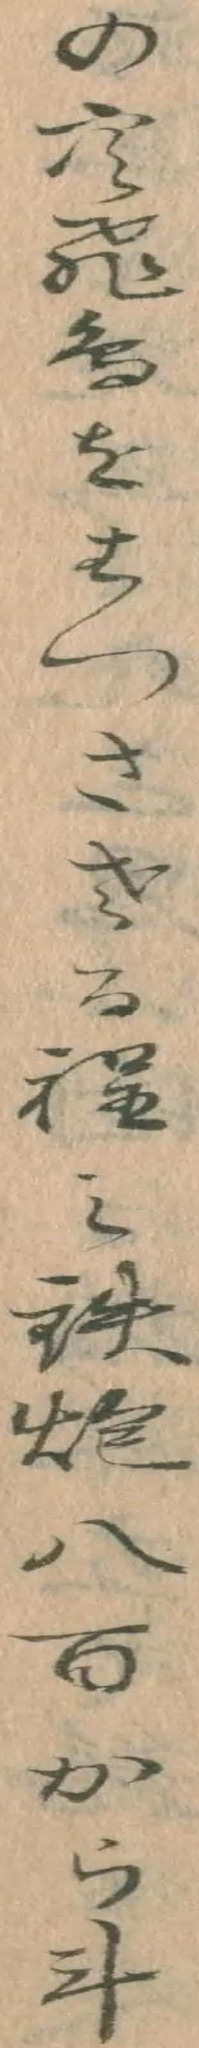の空飛鳥をはつささる程之鉄炮八百から計
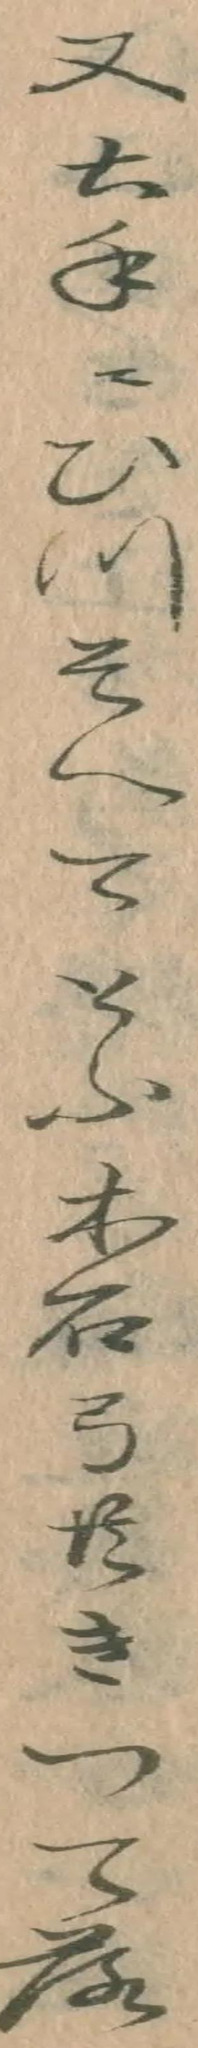又土手にひつそへてとふ木石弓共きつて落
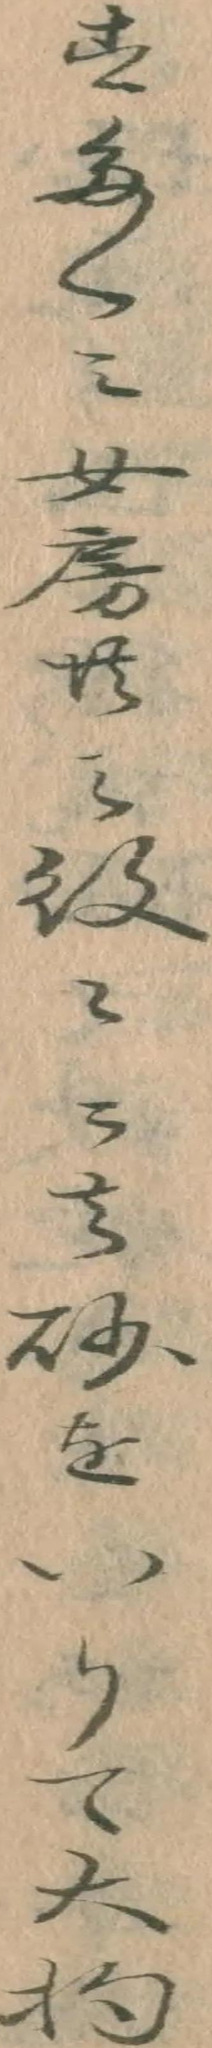すたゝみ女房共之役々には砂をいりて大杓
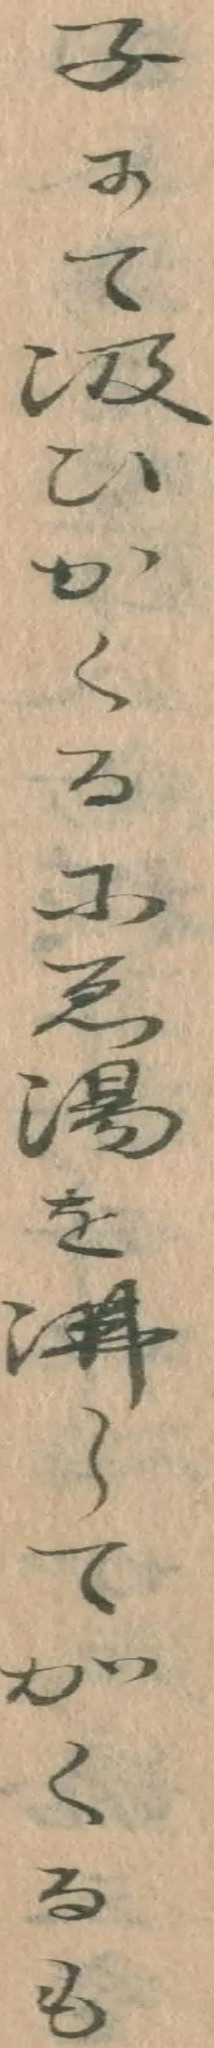子にて汲ひかくるにゑ湯を沸してかくるも
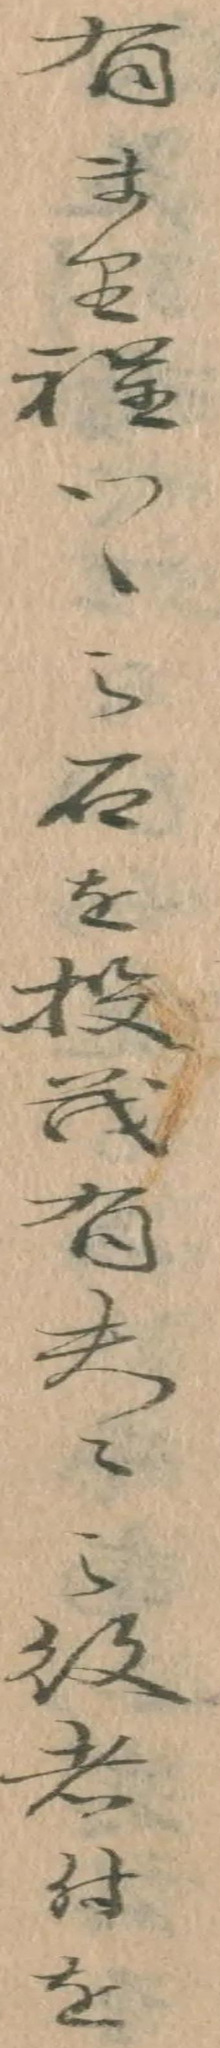有まり程つゝら石を投も有夫々之役者付を
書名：切支丹御退治記 49巻. [3]
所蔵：国立国会図書館 National Diet Library, JAPAN
